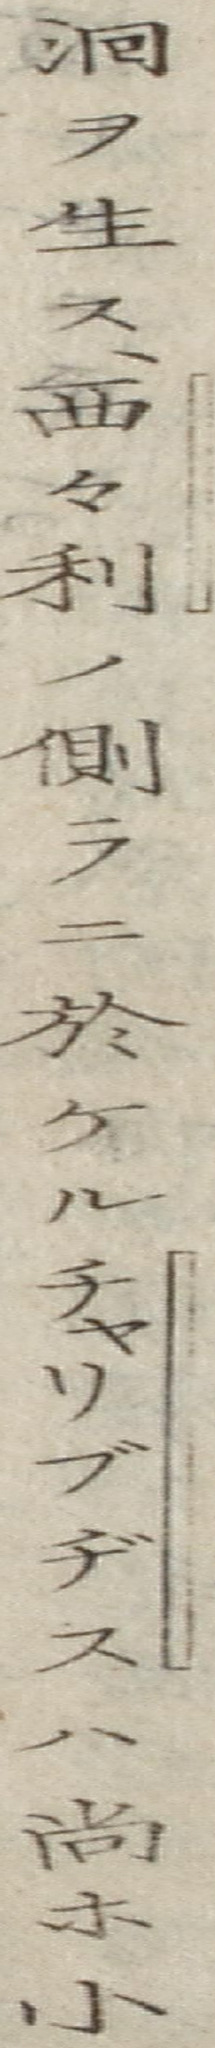泂ヲ生ス、西々利ノ側ラニ於ケルチャリブヂスハ尚ホ小
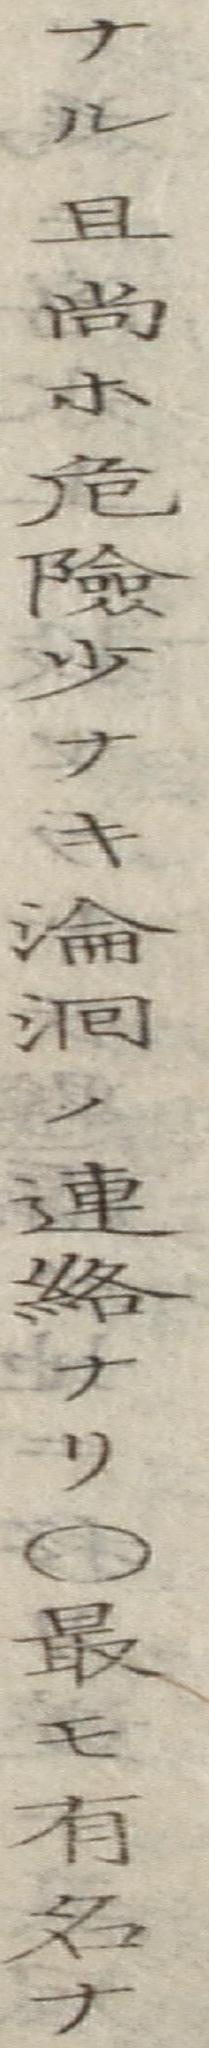ナル且尚ホ危険少ナキ淪泂ノ連絡ナリ○最モ有名ナ
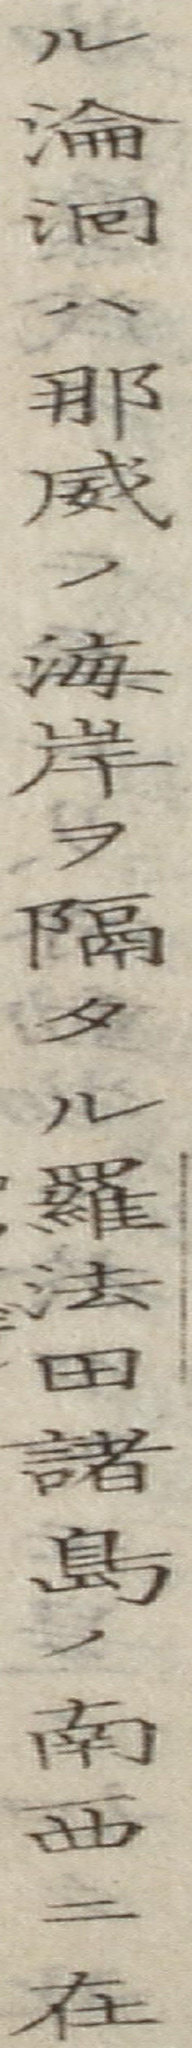ル淪泂ハ那威ノ海岸ヲ隔タル羅法田諸島ノ南西ニ在
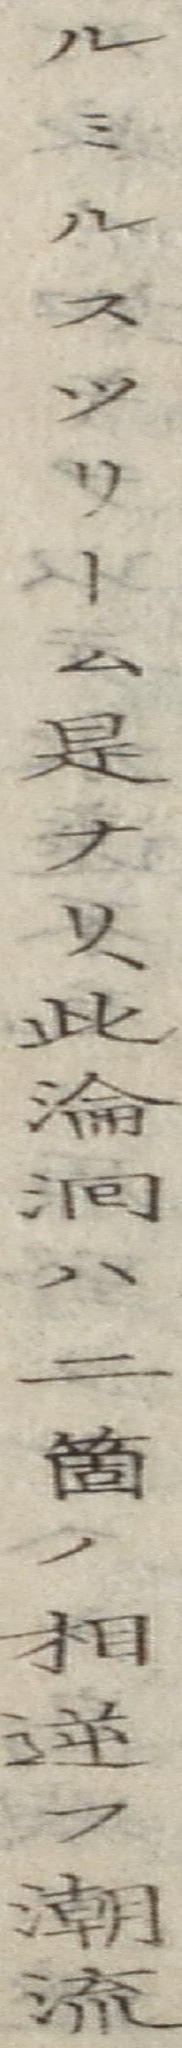ルミルスツリーム是ナリ、此淪泂ハニ箇ノ相逆フ潮流
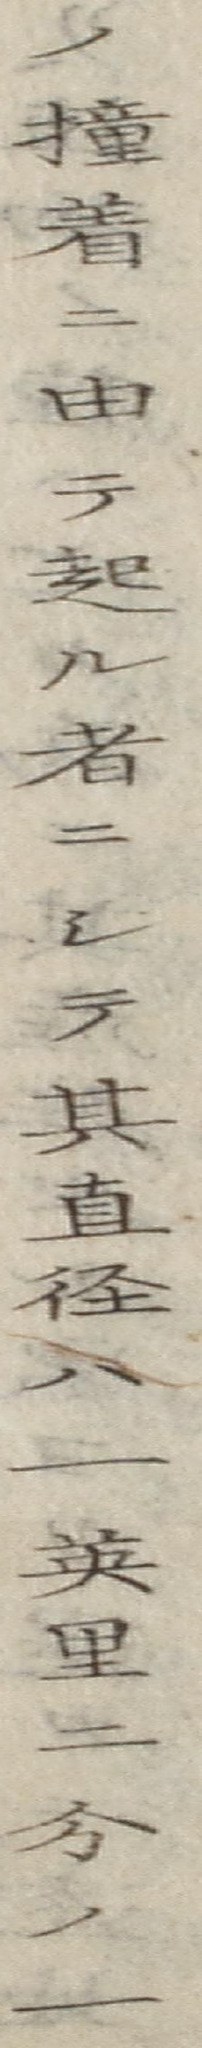ノ撞着ニ由テ起ル者ニシテ其直径ハ一英里二分ノ一
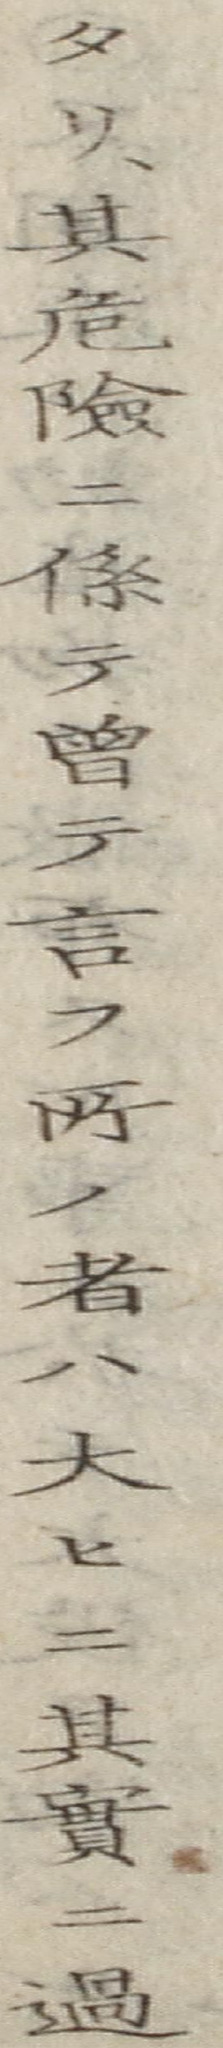タリ、其危険ニ係テ曾テ言フ所ノ者ハ大ヒニ其實ニ過
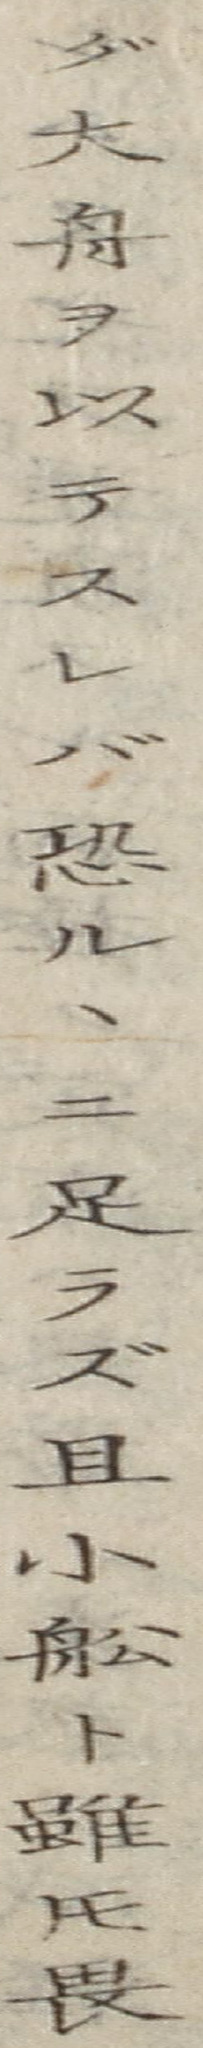グ大舟ヲ以テスレバ恐ルヽニ足ラズ且小舩ト雖トモ畏
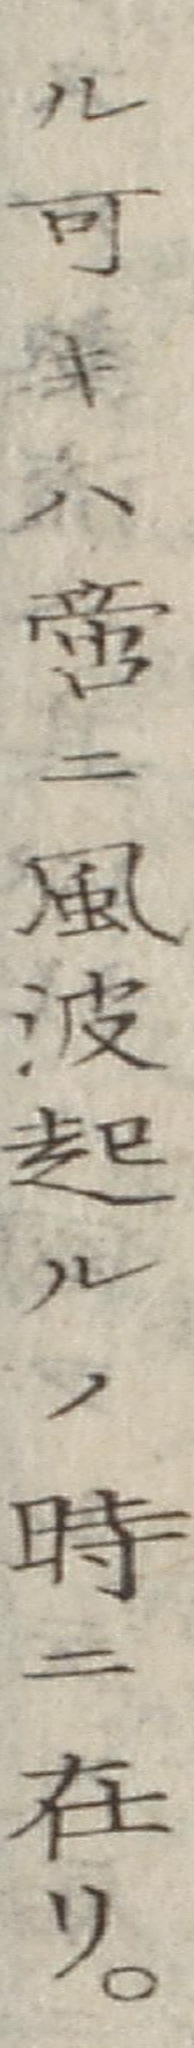ル可キハ啻ニ風波起ルノ時ニ在リ。
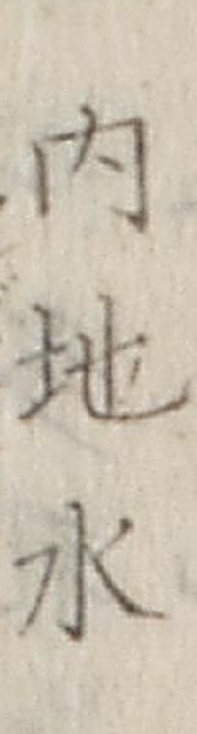内地水
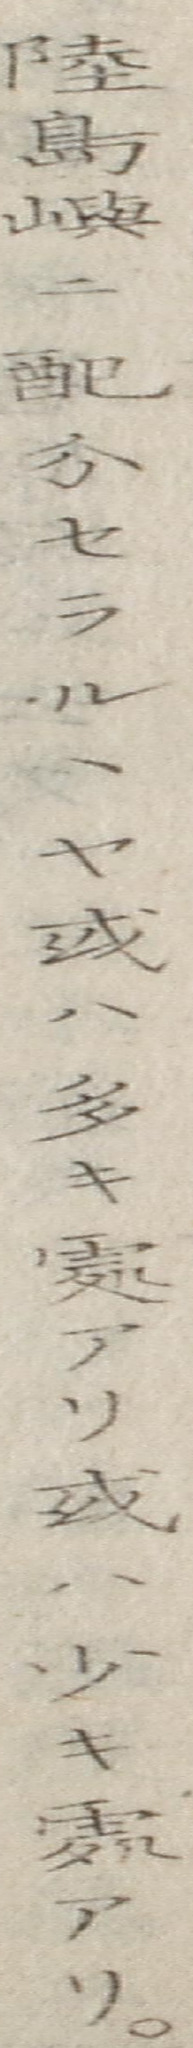陸島嶼ニ配分セラルヽヤ或ハ多キ處アリ或ハ少キ處アリ。
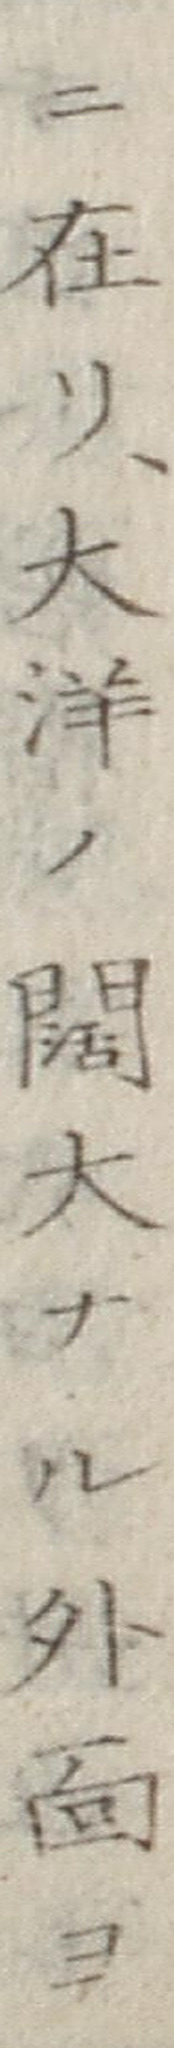ニ在リ、大洋ノ闊大ナル外面ヨ
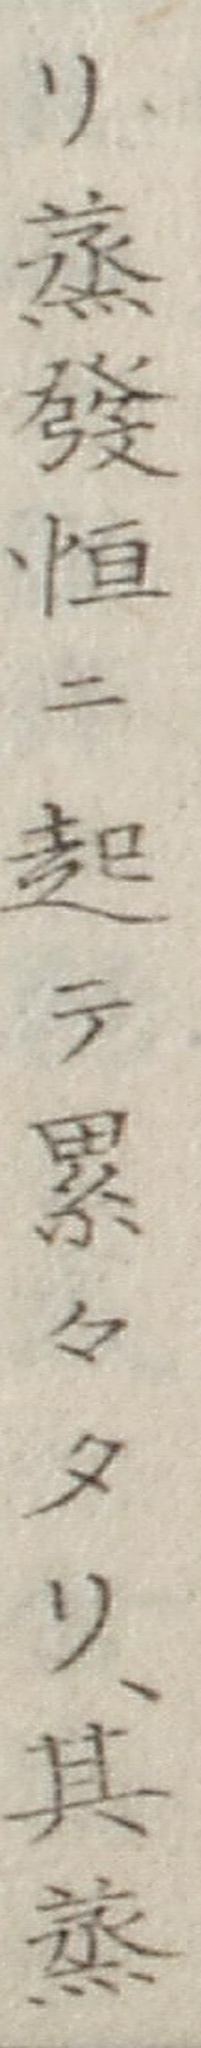リ蒸発恒ニ起テ累々タリ、其蒸
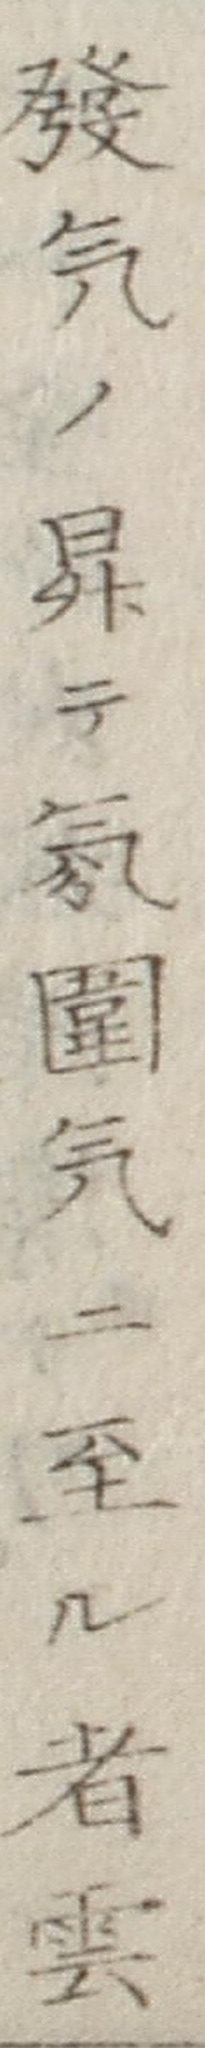発気ノ昇テ雰囲気ニ至ル者雲
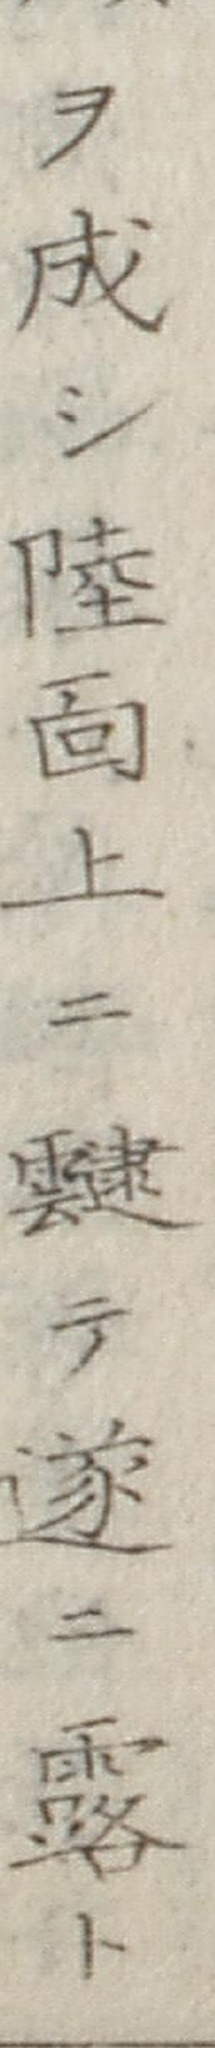ヲ成シ陸面上ニ靆テ遂ニ露ト
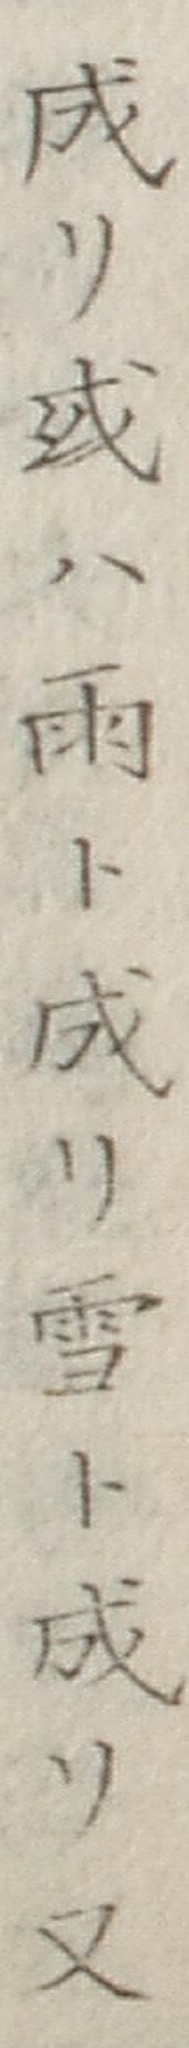成リ或ハ雨ト成リ雪ト成リ又
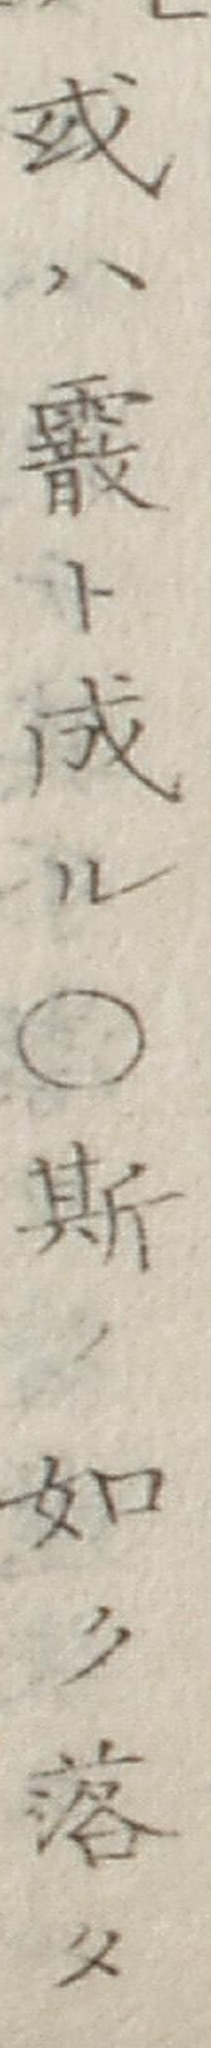或ハ霰ト成ル○斯ノ如ク落タ
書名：地形論　巻二
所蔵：東京大学地震研究所図書室 Earthquake Research Institute Library, The University of Tokyo, JAPAN
